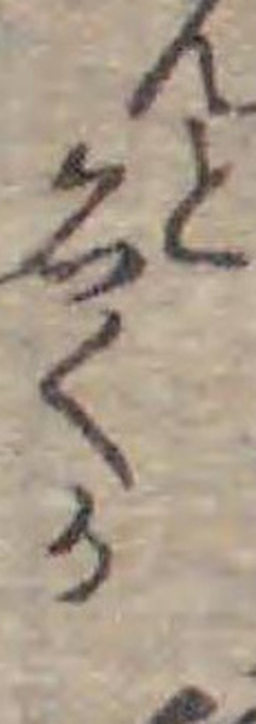名くか
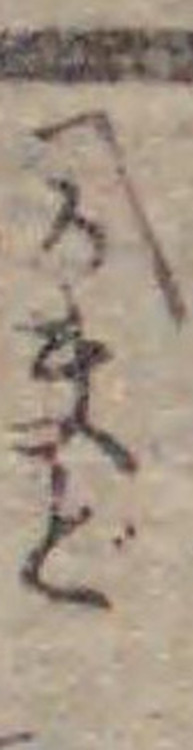〽かまど
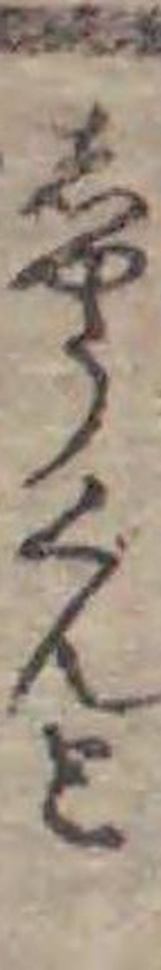しやうぐんと
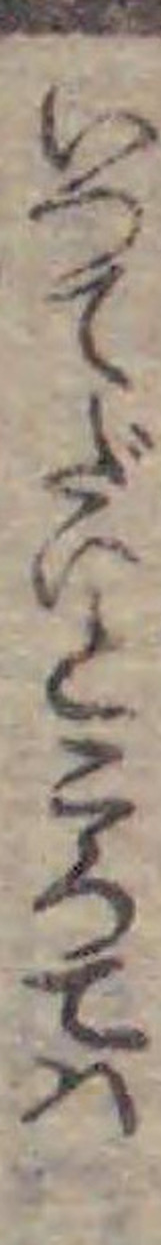いつてだいところては
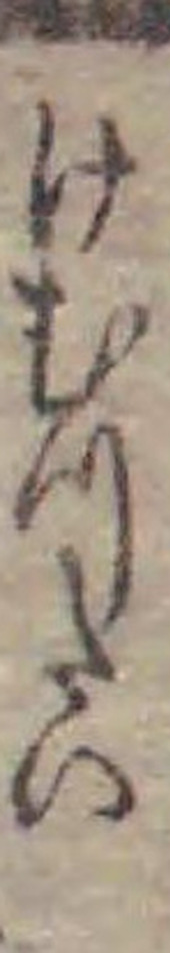けむつたい
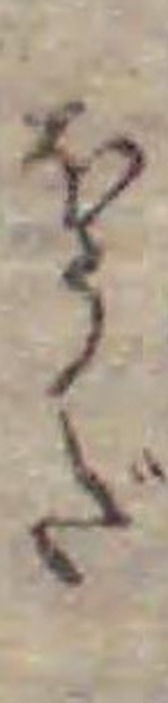ほうだ

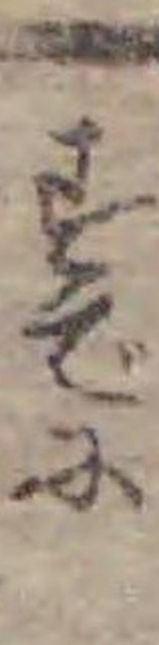すでに
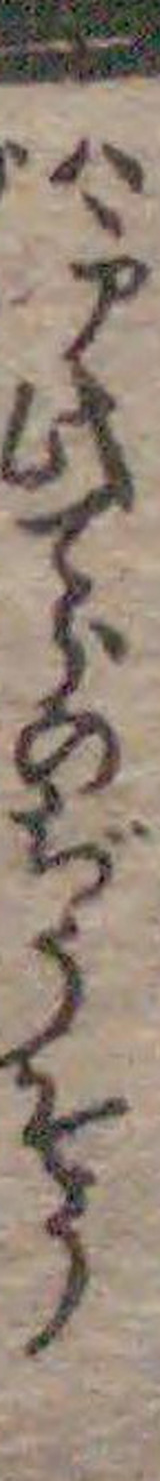ハヽア此てらのじうそう
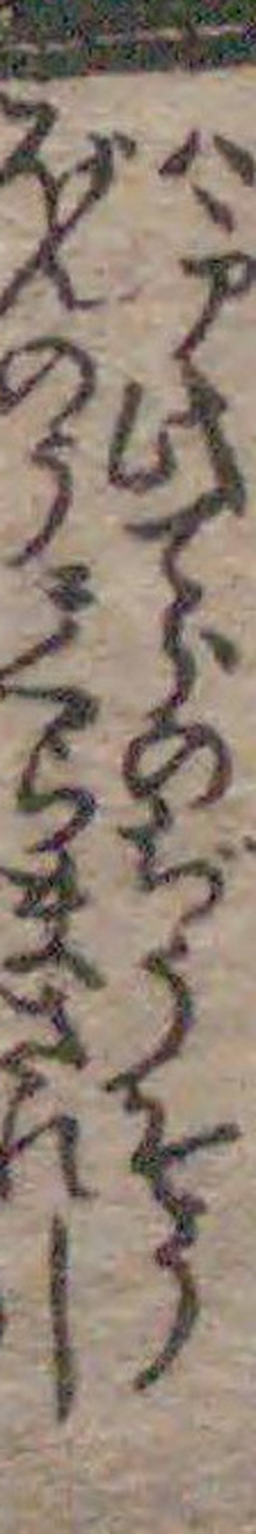ぼんのうにくらまされし
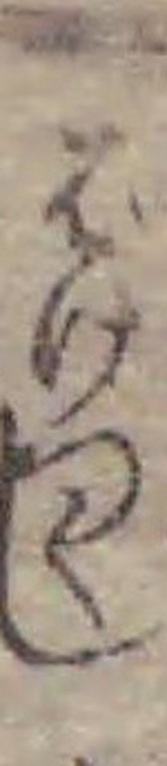ばけつくし
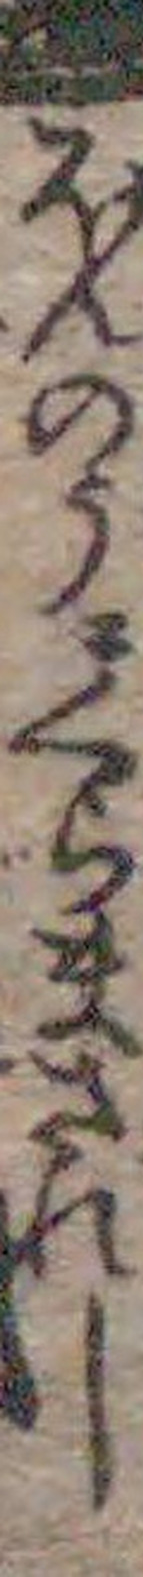ぼんのうにくらまされし
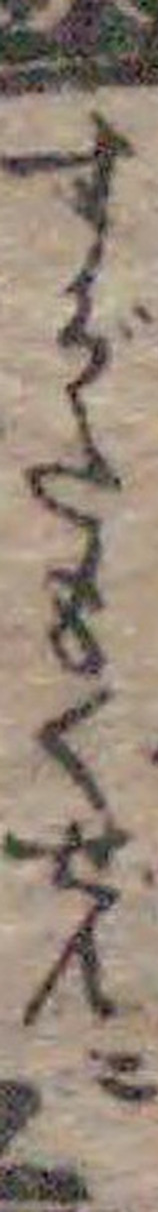すがたもくぜんに
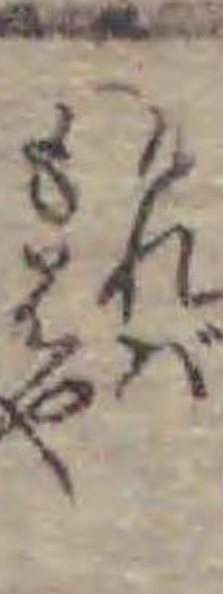もはや
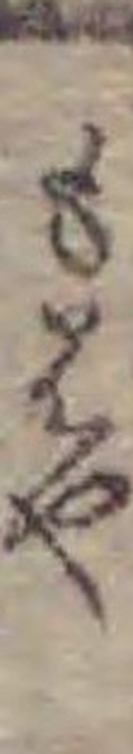もはや
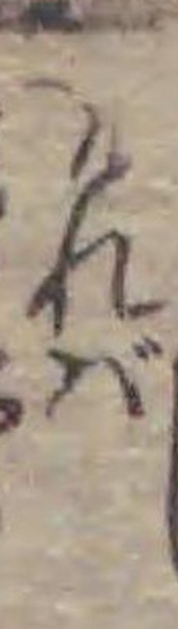ければ
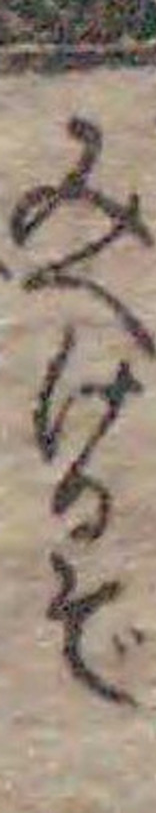みへけるぞ
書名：歌の化物一寺再興 : 2巻
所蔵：国立国会図書館 National Diet Library, JAPAN
